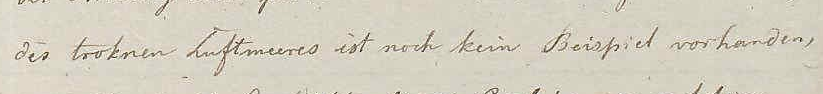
des troknen Luftmeeres ist noch kein Beispiel vorhanden,
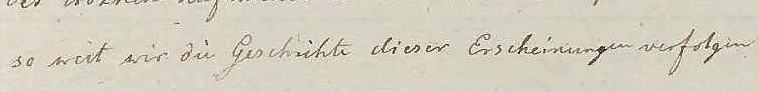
so weit wir die Geschichte dieser Erscheinungen verfolgen
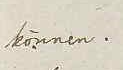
können.
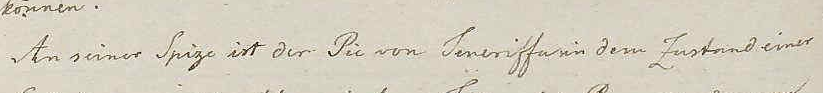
An seiner Spize ist der Pic von Teneriffa in dem Zustand einer
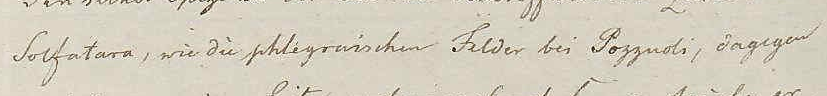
Solfatara, wie die phlegraischen Felder bei Pozzuoli, dagegen
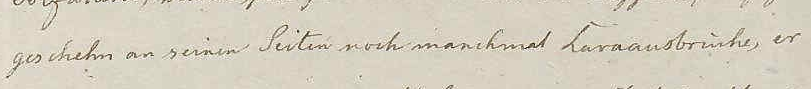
geschehn an seinen Seiten noch manchmal Lavaausbrüche, er
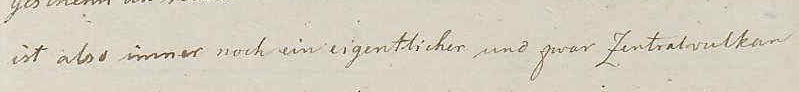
ist also immer noch ein eigentlicher und zwar Zentralvulkan
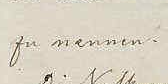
zu nennen.
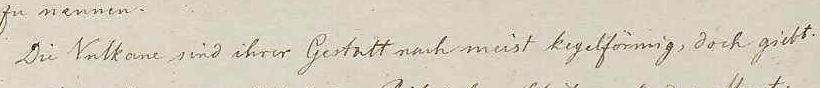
Die Vulkane sind ihrer Gestalt nach meist kegelförmig, doch giebt
